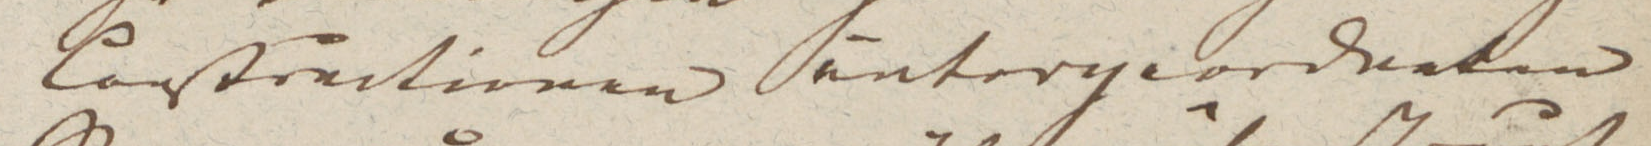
Constructionen untergeordneten
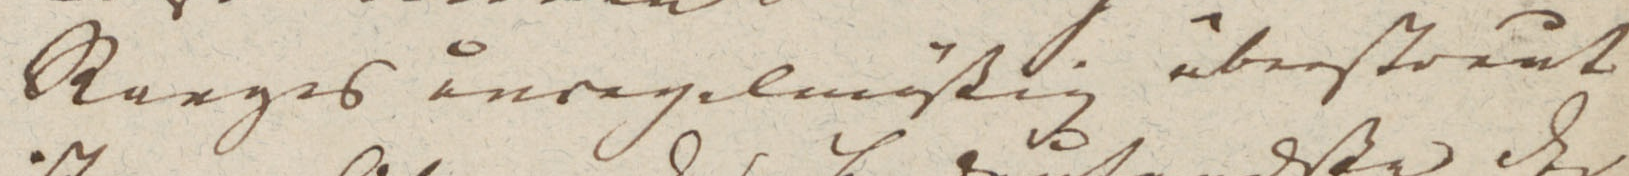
Ranges unregelmässig überstreut
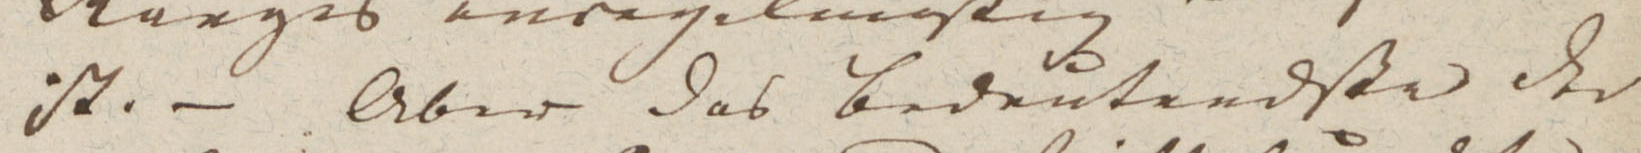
ist. – Aber das Bedeutendste der
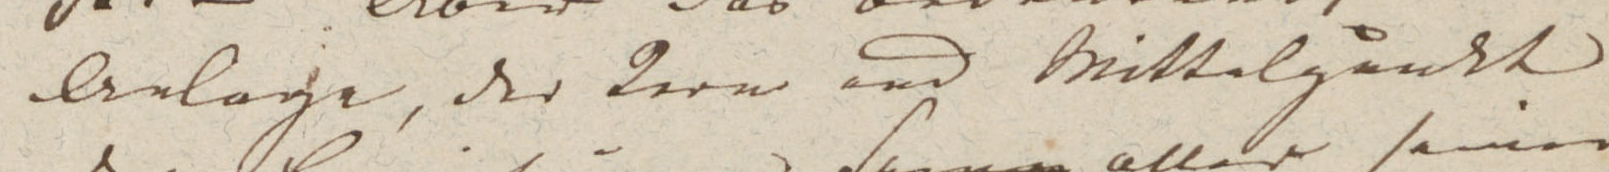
Anlage, der Kern und Mittelpunkt
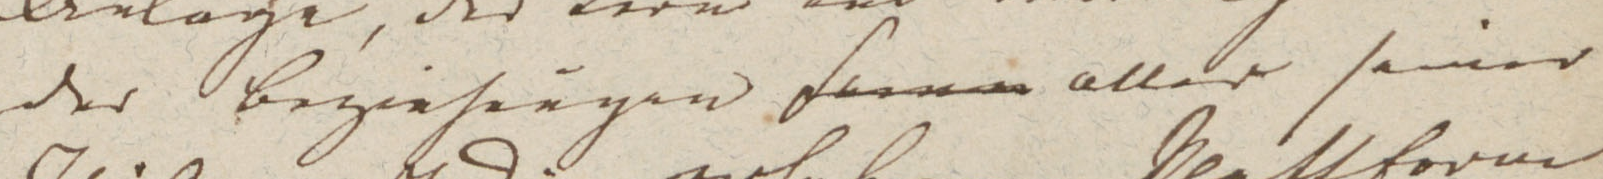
der Beziehungen seine aller seiner
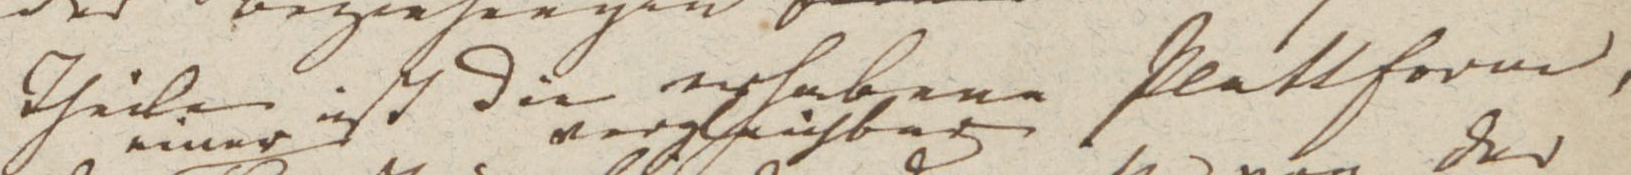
Theile ist die erhabene Plattform,
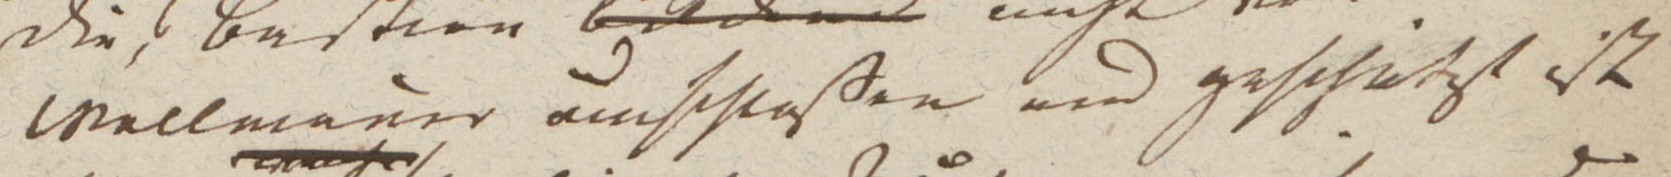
Wallmauer umschlossen und geschützt ist
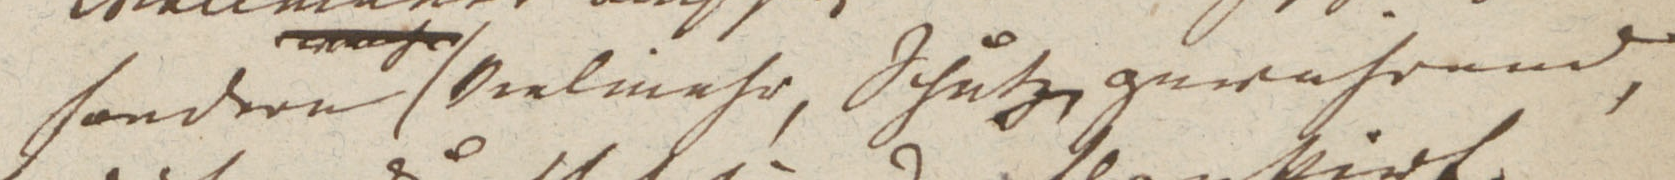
sondern welche vielmehr, Schutz gewährend,
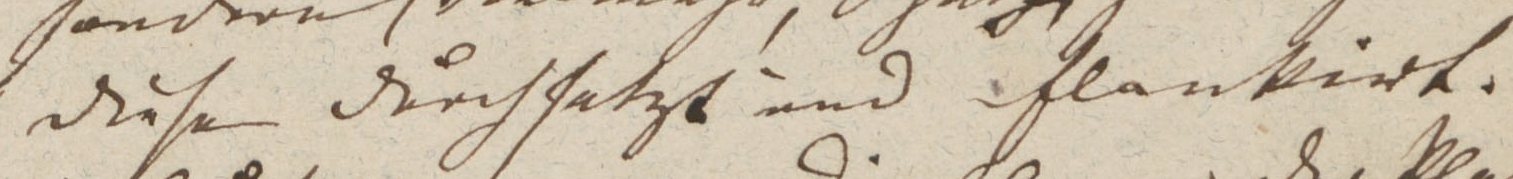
diese durchsetzt und flankirt.
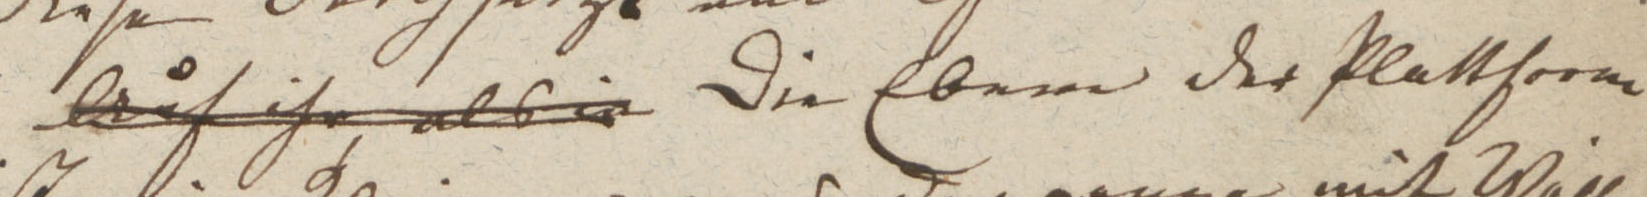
Auf ihr als in Die Ebene der Plattform
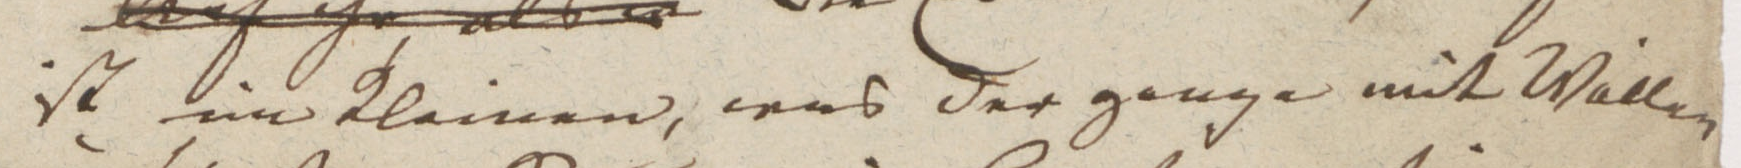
ist im Kleinen, was der ganze mit Wällen
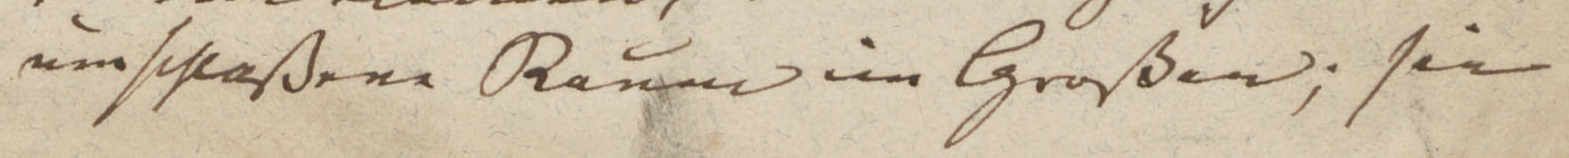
umschlossene Raum im Grossen; sie
